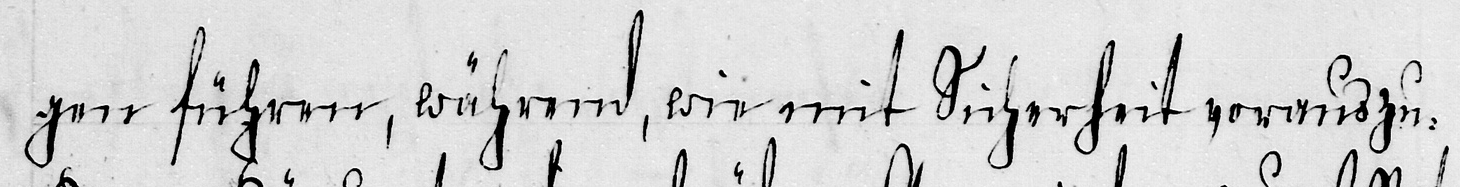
gen führen, während, wie mit Sicherheit vorauszu¬
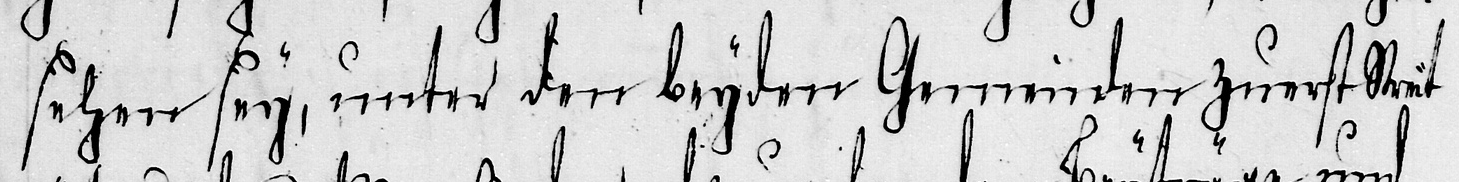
sehen sey, unter den beyden Gemeinden zuerst Stre¬
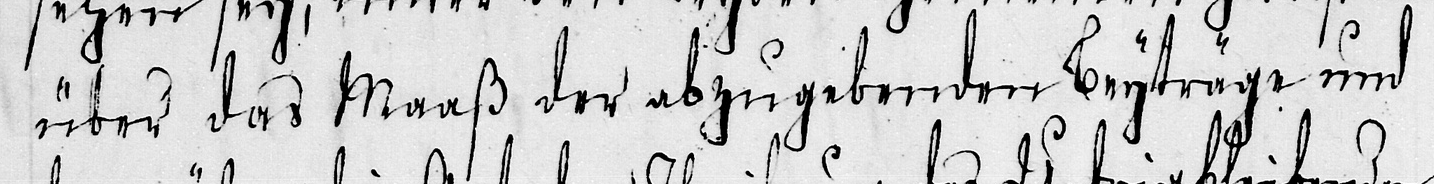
über das Maaß der abzugebenden Beyträge und
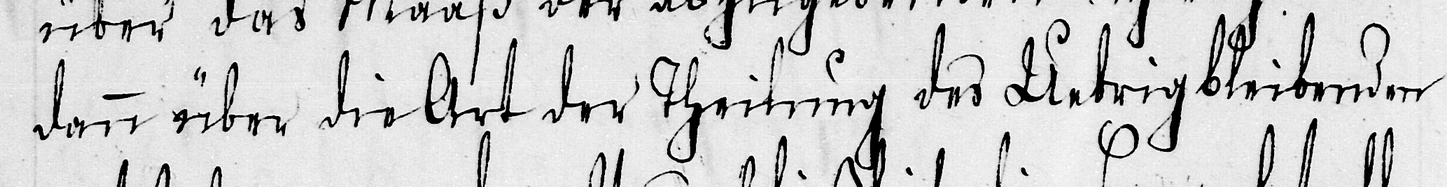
dann über die Art der Theilung des Uebrigbleibenden
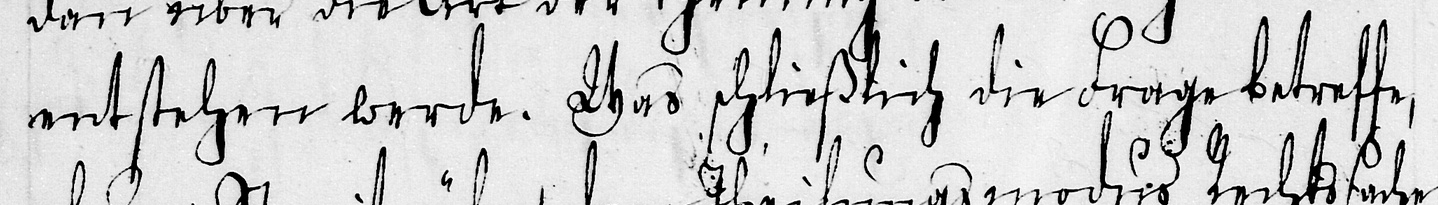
entstehen werde. Was schließlich die Frage betreff¬
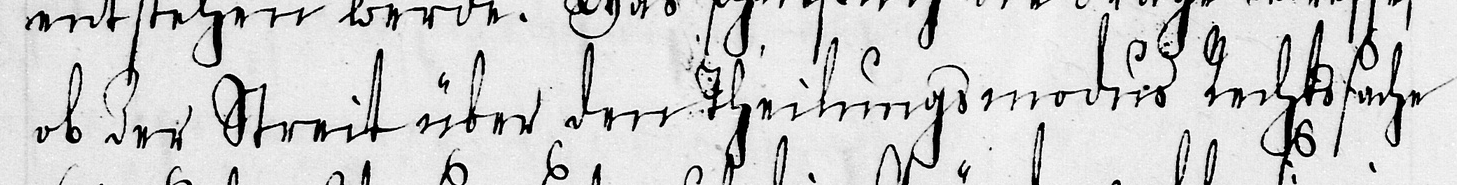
ob der Streit über den Theilungsmodus Rechtssache
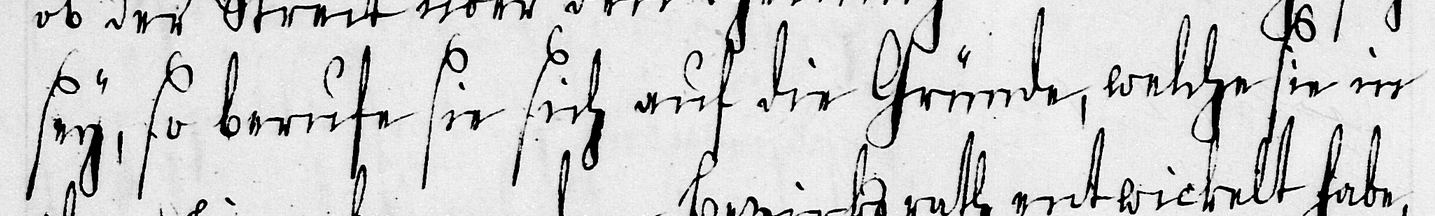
sey, so berufe sie sich auf die Gründe, welche sie in
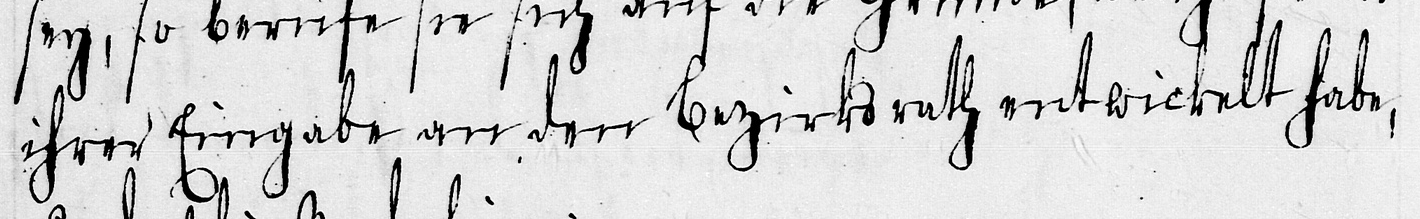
ihrer Eingabe an den Bezirksrath entwickelt habe,
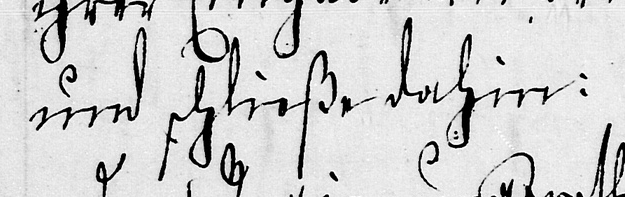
und schließe dahin:
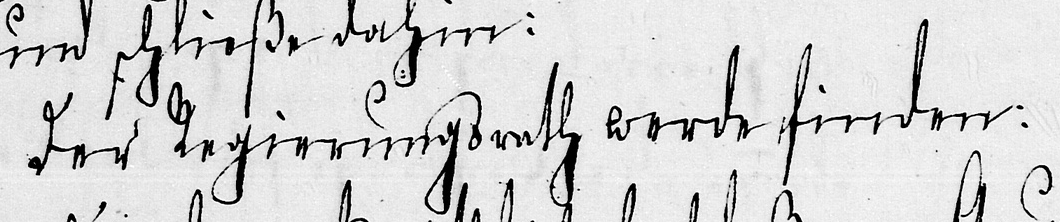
Der Regierungsrath werde finden:
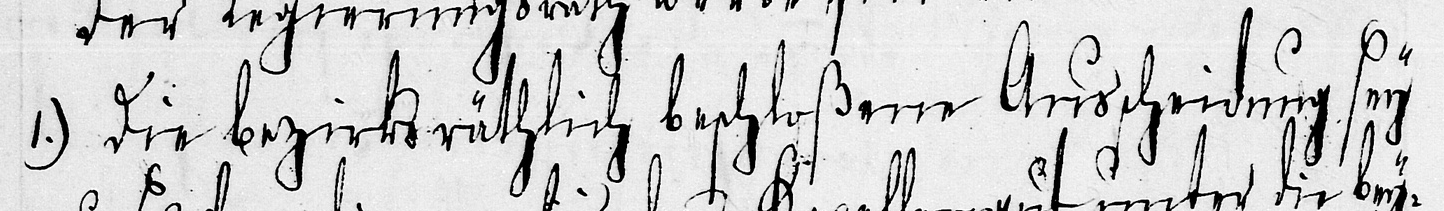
1.) Die bezirksräthlich beschloßene Ausscheidung sey
